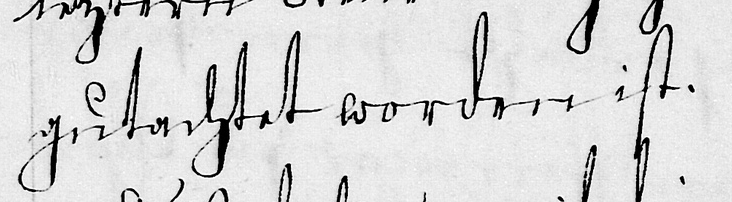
gutachtet worden ist.
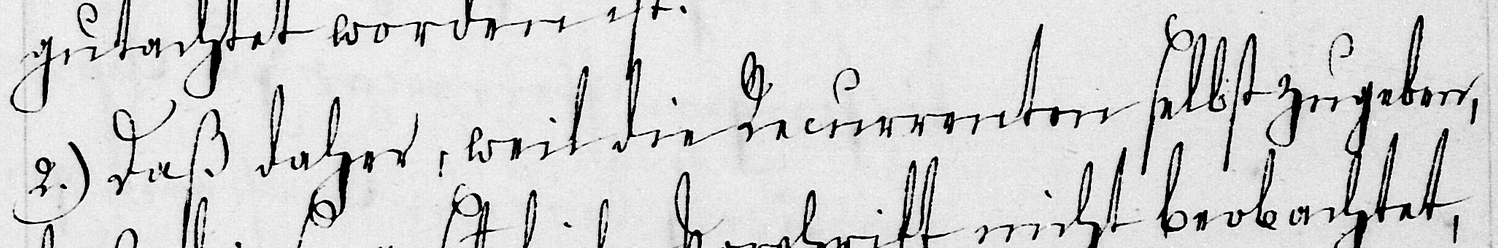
2.) Daß daher, weil die Recurrenten selbst zugeben,
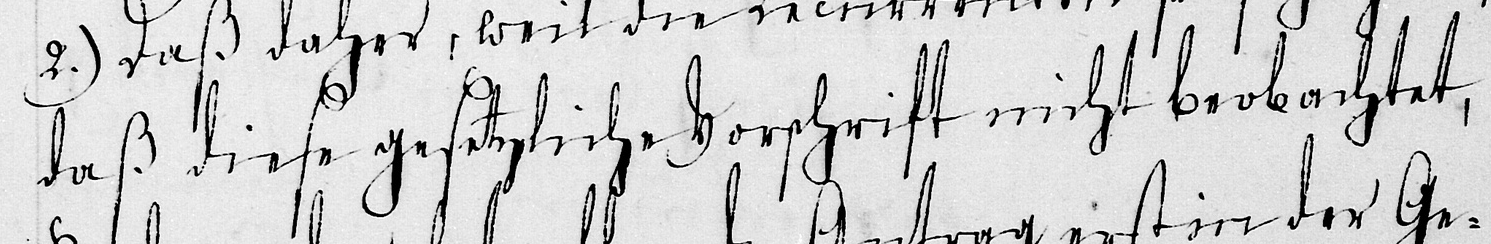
daß diese gesetzliche Vorschrift nicht beobachtet,
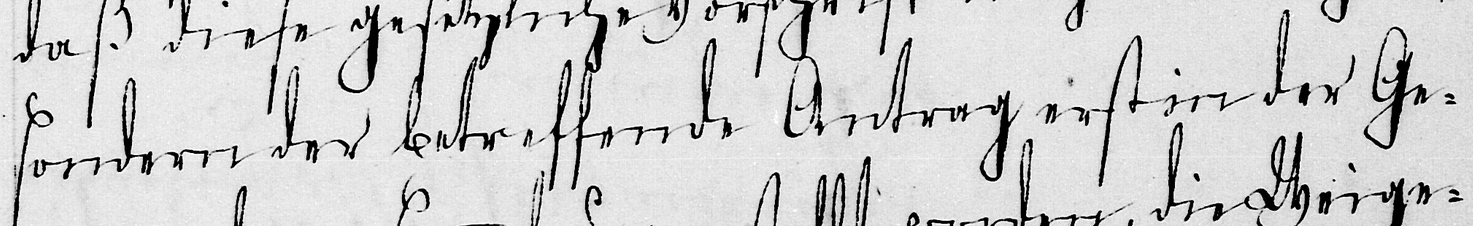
sondern der betreffende Antrag erst in der Ge¬
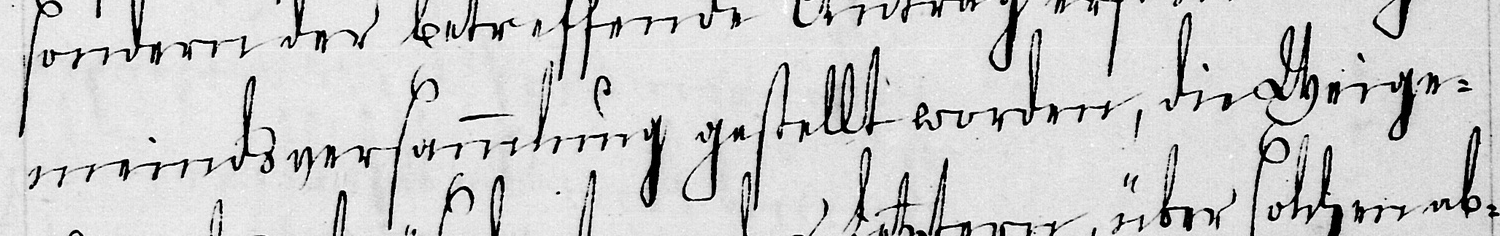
meindsversammlung gestellt worden, die Weige¬
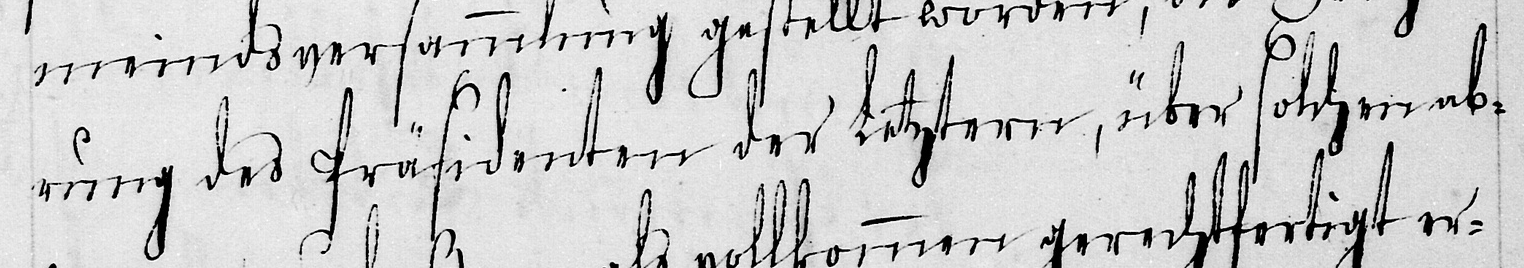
rung des Präsidenten der Letztern, über solchen ab¬
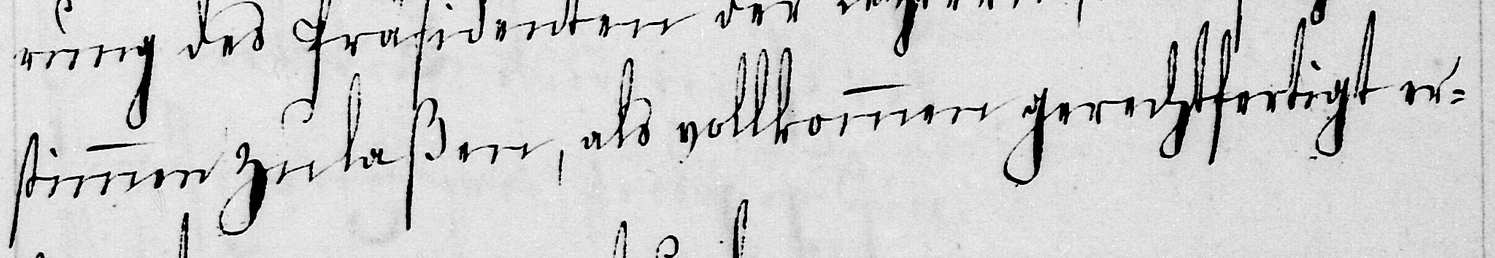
stimmen zu laßen, als vollkommen gerechtfertigt er¬
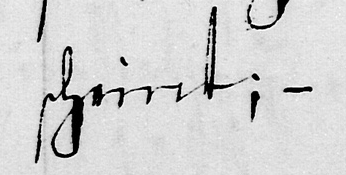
scheint; –
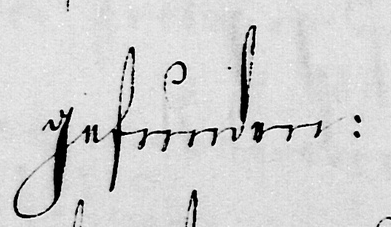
gefunden:
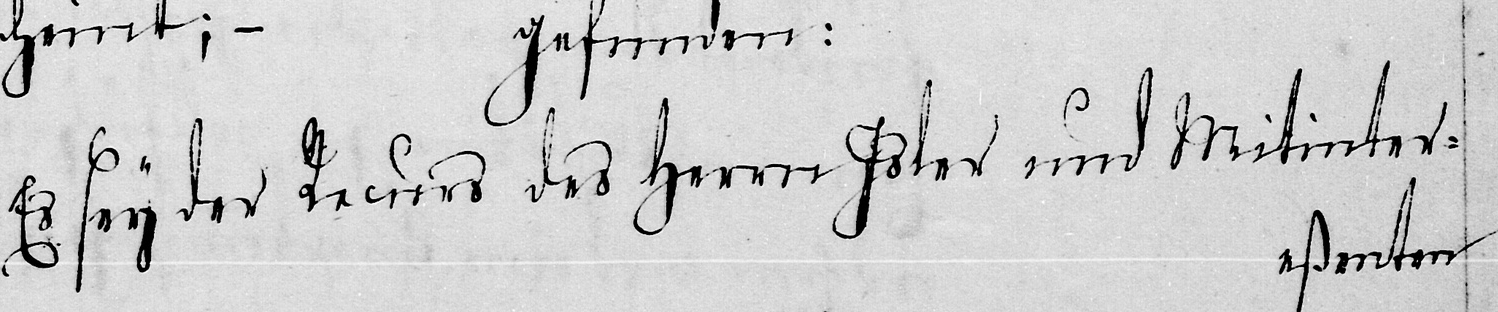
Es sey der Recurs des Herrn Isler und Mitinter-
